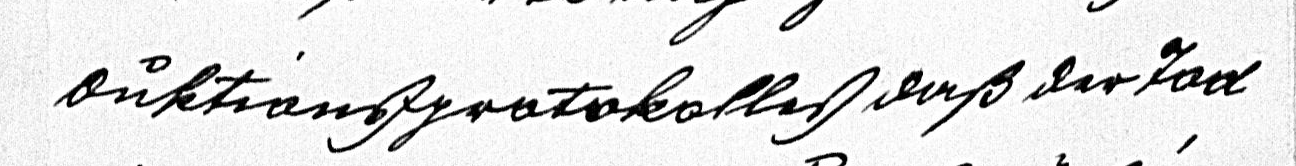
duktionsprotokolles daß der Tod
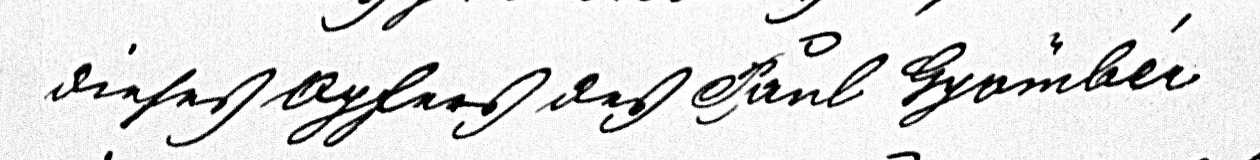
dieses Opfers des Paul Gyömbér
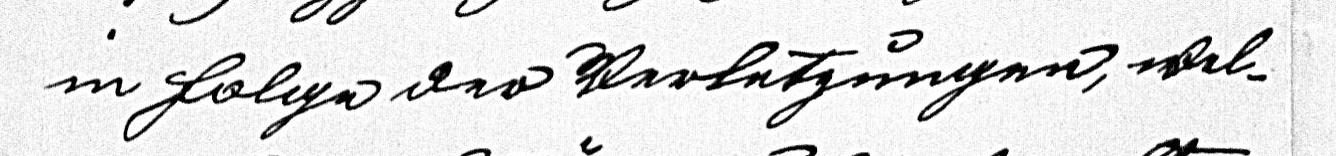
in Folge der Verletzungen, wel¬
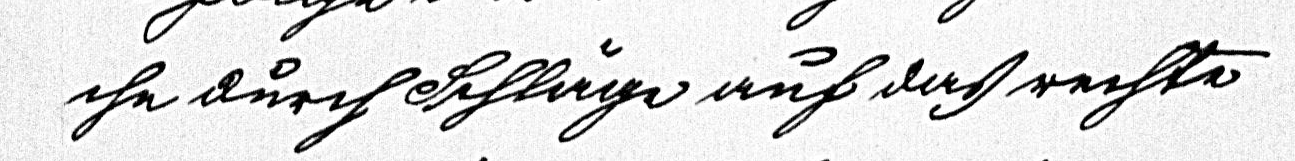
che durch Schläge auf das rechte
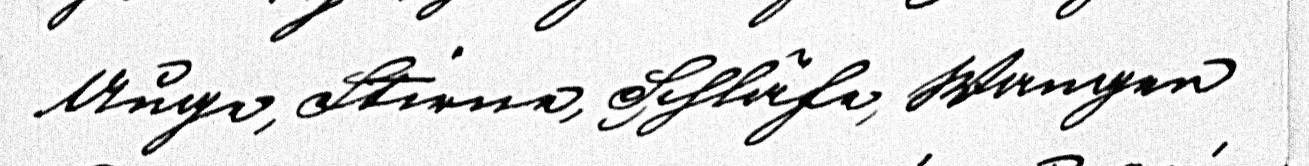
Auge, Stirne, Schläfe, Wangen
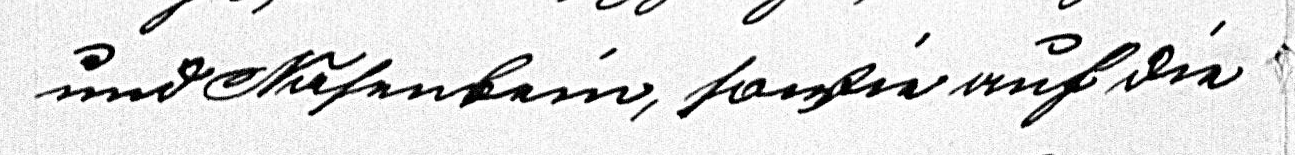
und Nasenbein, sowie auf die
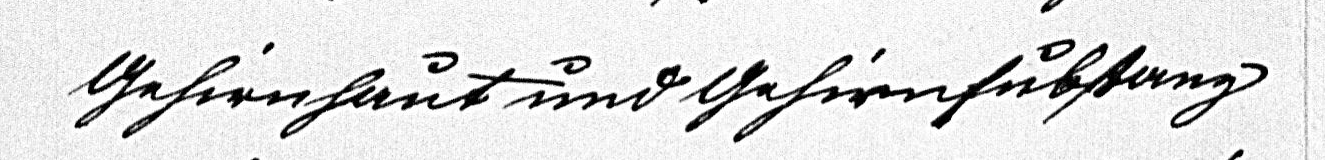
Gehirnhaut und Gehirnsubstanz
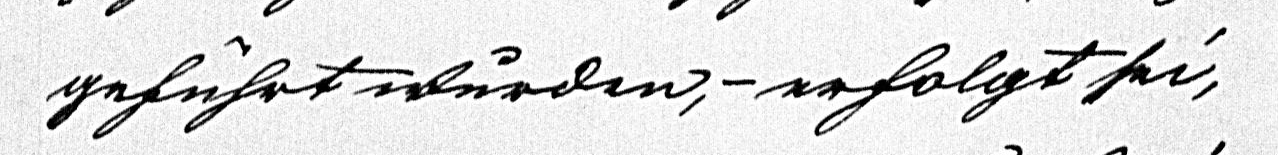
geführt wurden, - erfolgt sei,
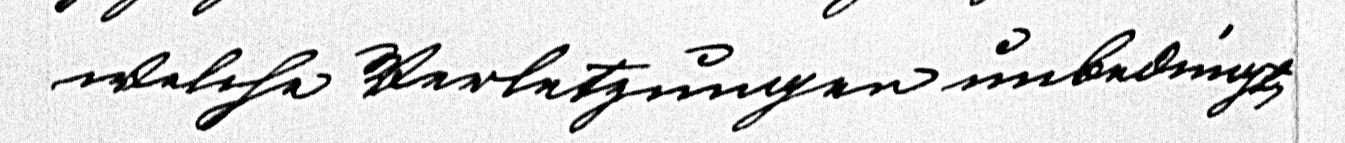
welche Verletzungen unbedingt,
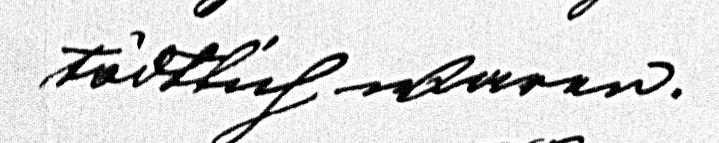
tödtlich waren.
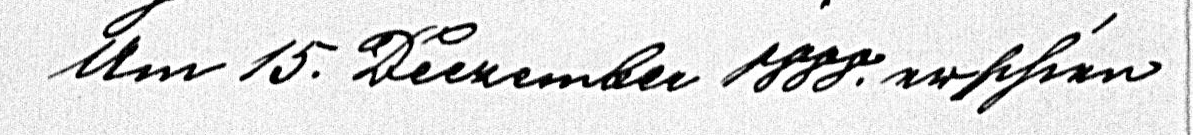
Am 15. Deczember 1888. erschien
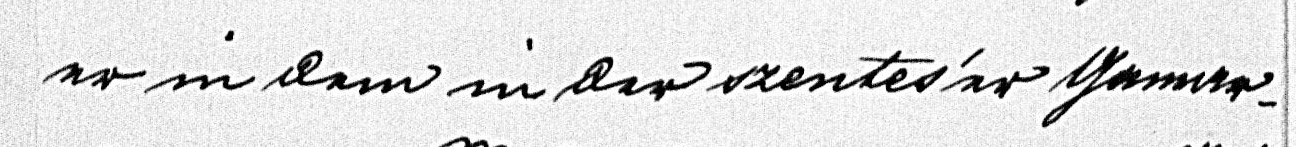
er in dem in der szentes'er Gemar¬
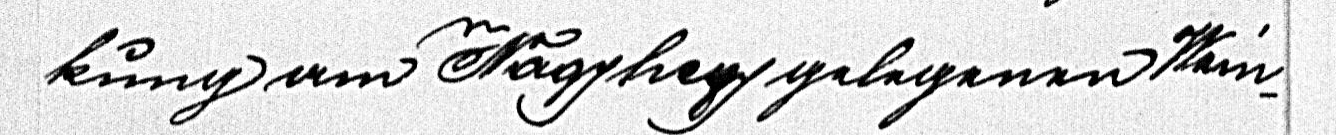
kung am Nagyhepy gelegenen Wein¬
